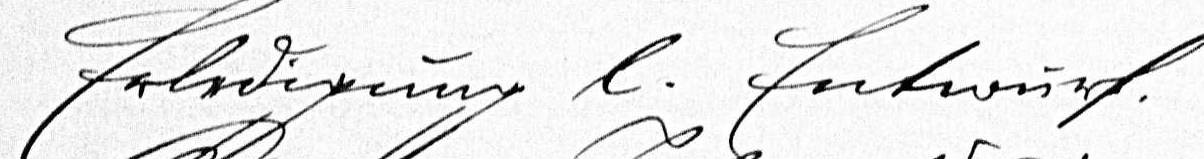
Erledigung, nach Entwurf
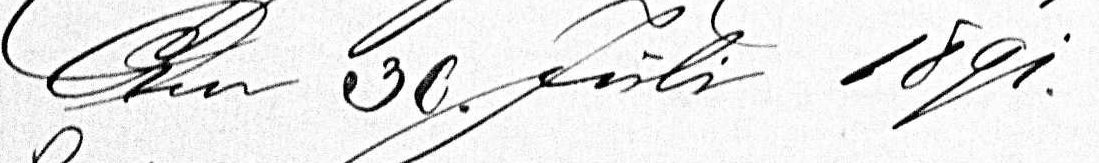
Am 30. Juli 1891
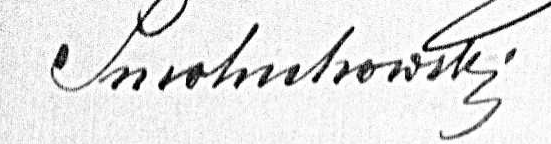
Smolnchowski
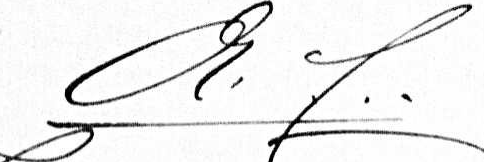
A. E.
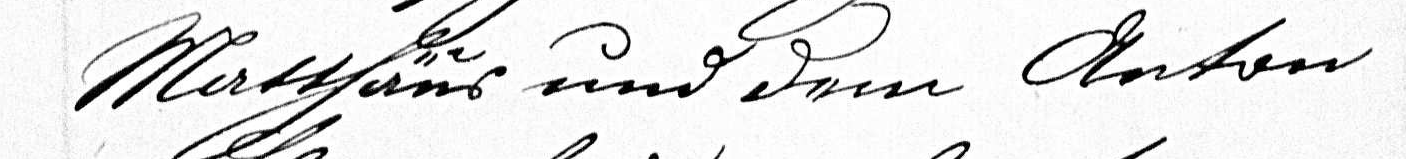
Matthäus und dem Anton
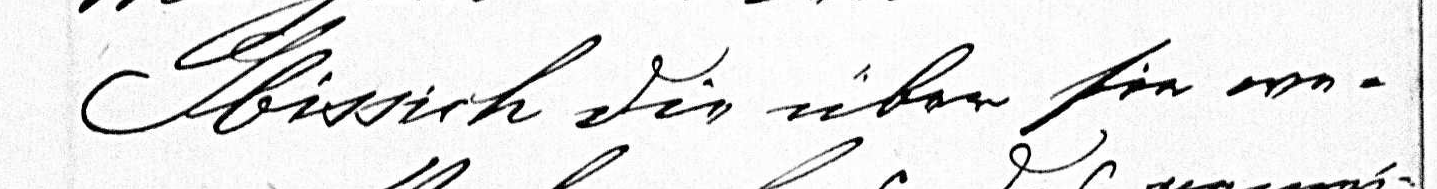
Sbissich die über sie we¬
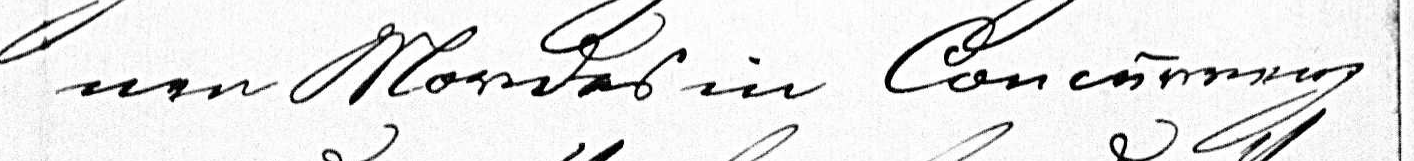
nen Mordes in Concurrenz
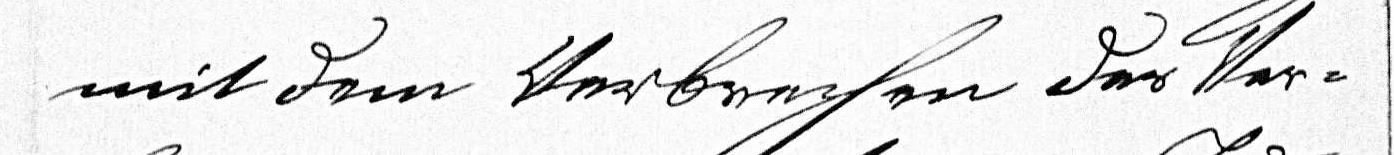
mit dem Verbrechen der Ver¬
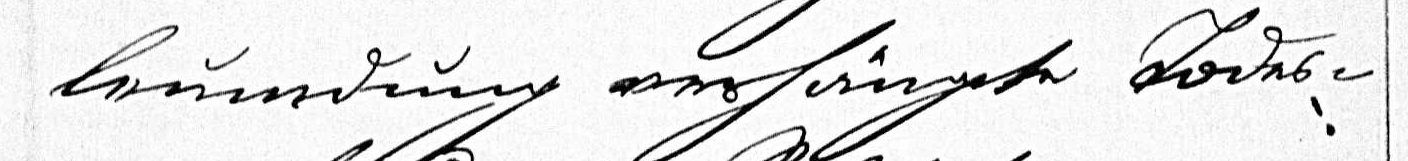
leumdung verhängte Todes¬
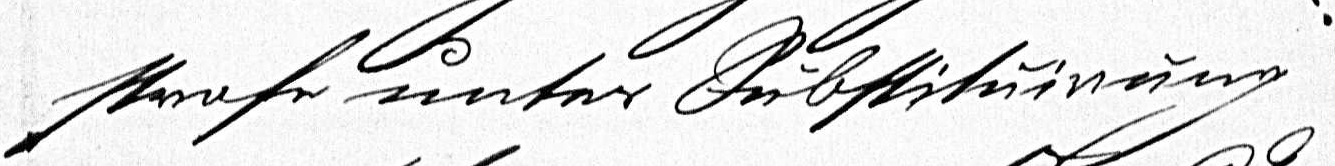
strafe unter Substituerung
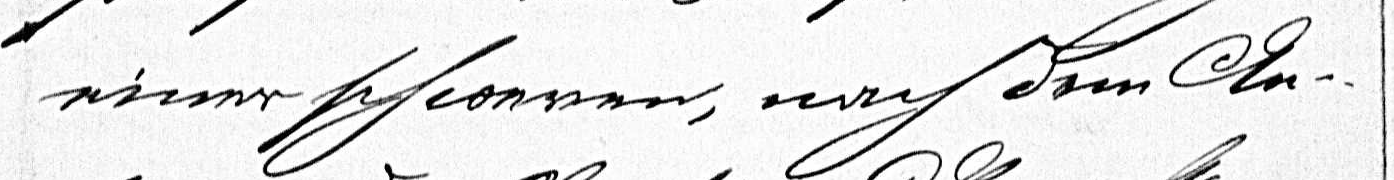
einer schweren, nach dem An¬
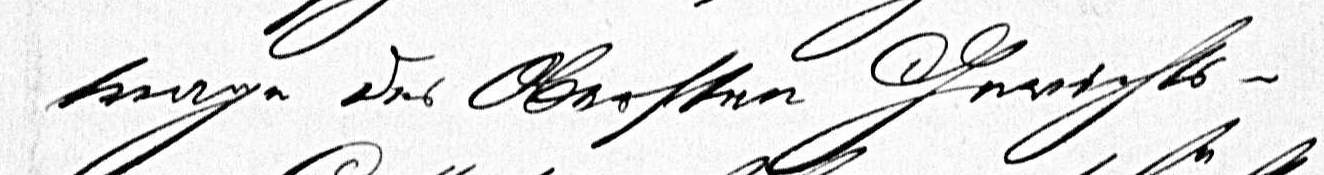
trage des Obersten Gerichts-
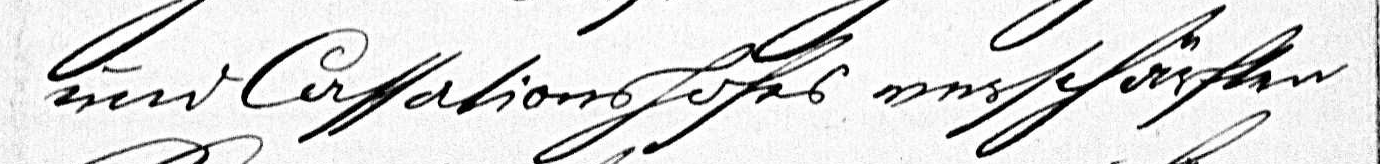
und Cassationshofes verschärften
